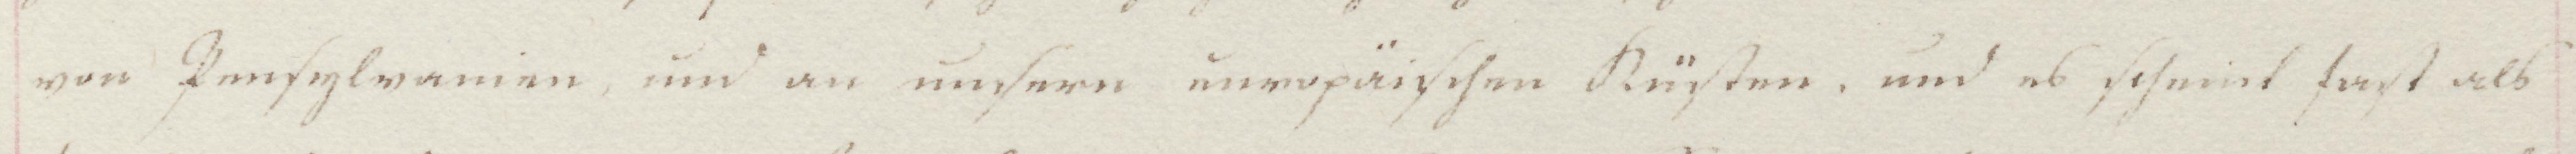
von Pensylvanien und an unsern europäischen Küsten, und es scheint fast als
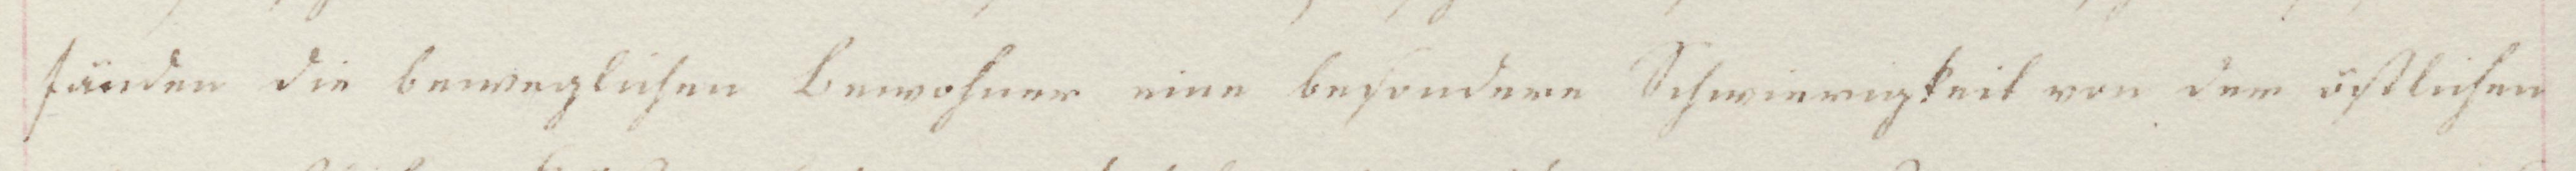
fänden die beweglichen Bewohner eine besondere Schwierigkeit von der östlichen
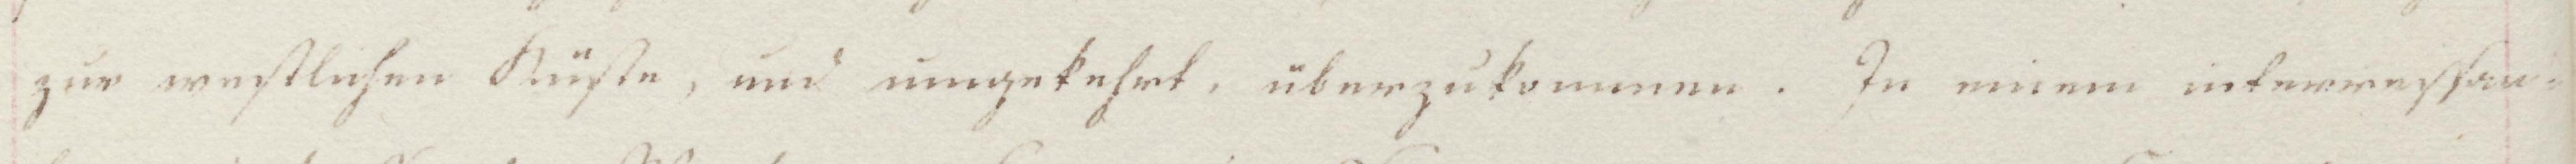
zur westlichen Küste, und umgekehrt, überzukommen. In einem interressan-
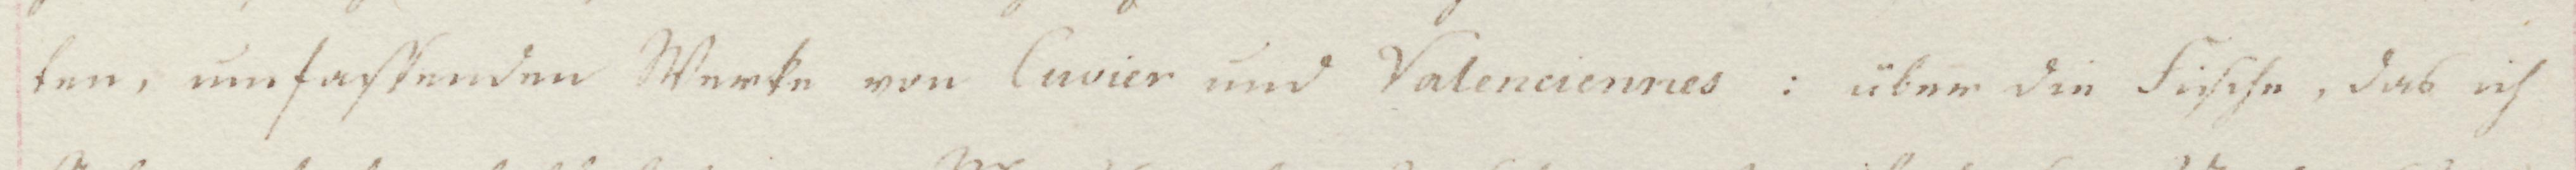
ten, umfassenden Werke von Cuvier und Valenciennes: über die Fische, das ich
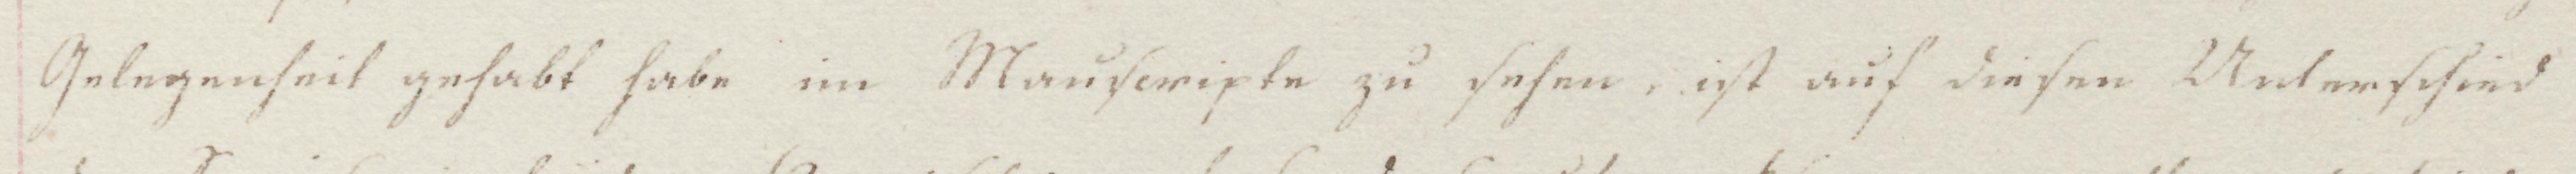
Gelegenheit gehabt habe im Manuscripte zu sehen, ist auf diesen Unterschied
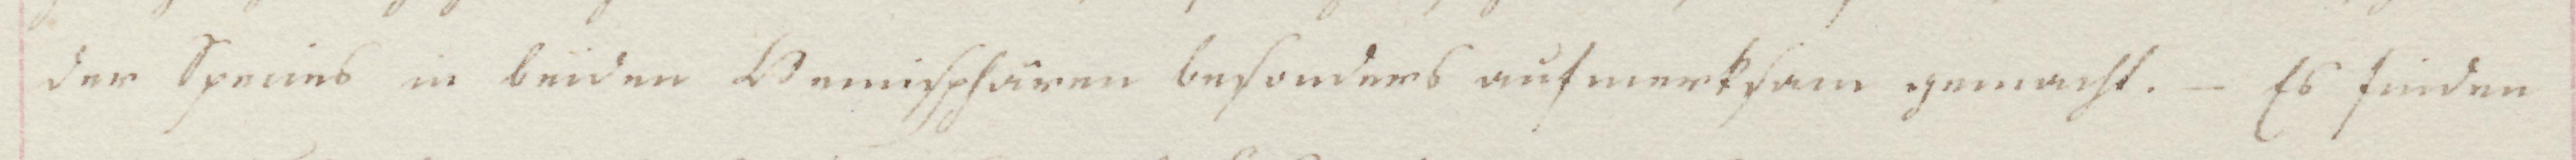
der Species in beiden Hemisphären besonders aufmerksam gemacht. – Es finden
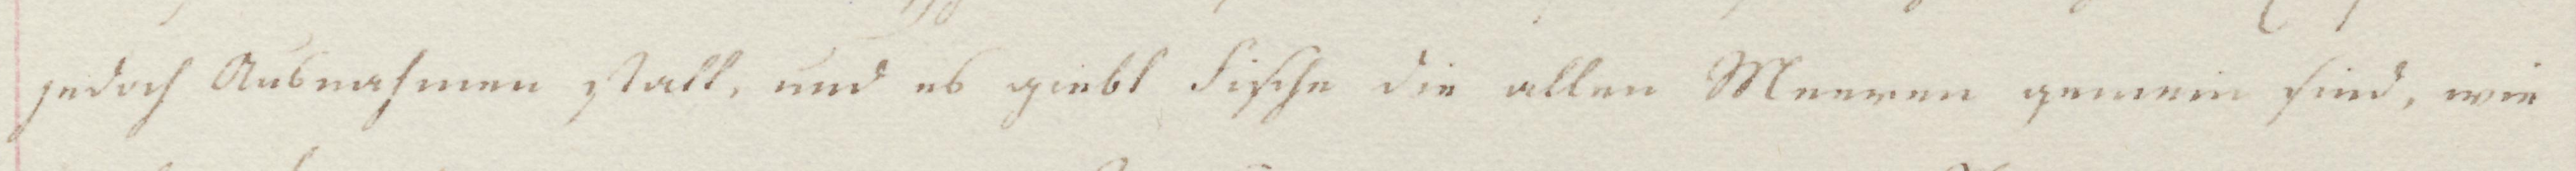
jedoch Ausnahmen statt, und es giebt Fische die allen Meeren gemein sind, wie
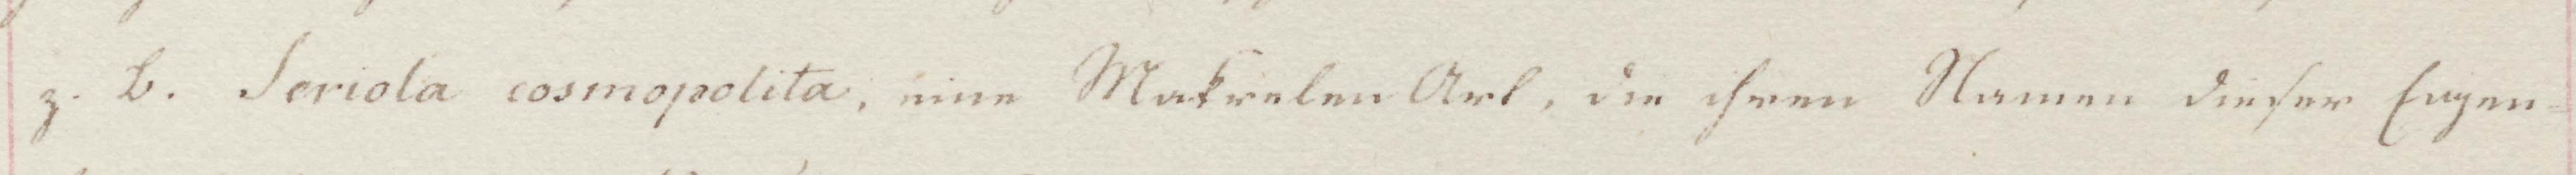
z. B. Seriola cosmopolita, eine Makrelen Art, die ihren Namen dieser Eigen-
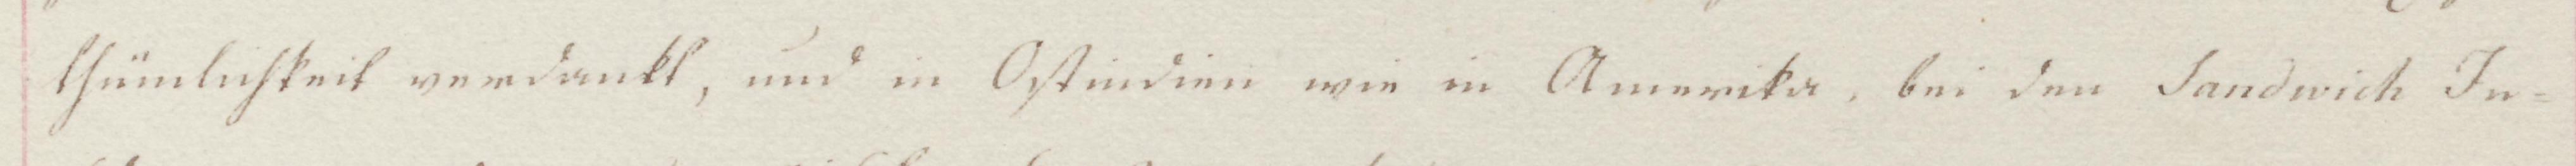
thümlichkeit verdankt, und in Ostindien wie in Amerika, bei den Sandwich In-
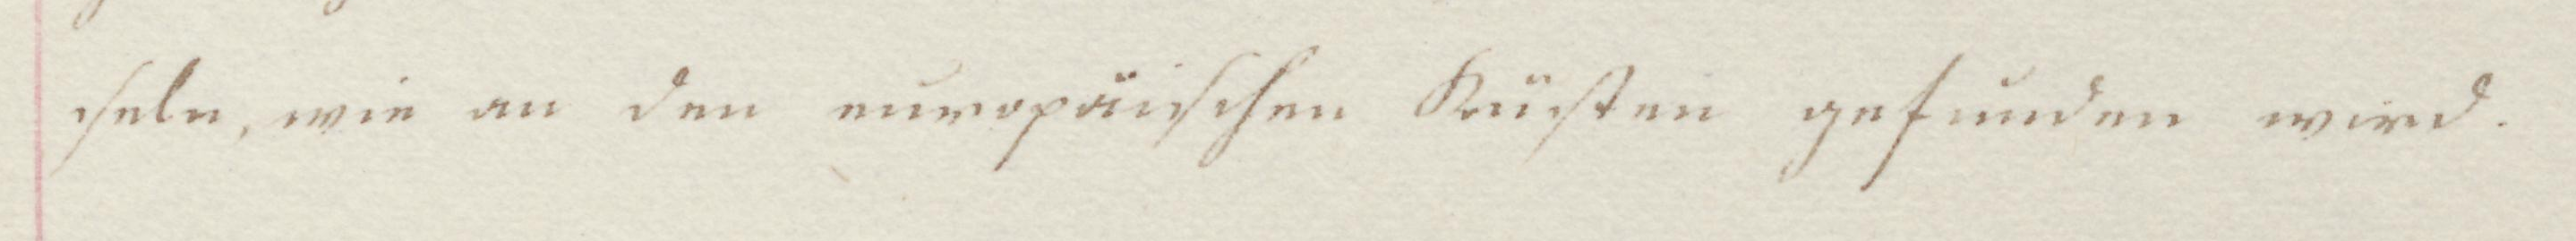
seln, wie an den europäischen Küsten gefunden wird.
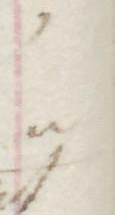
7–
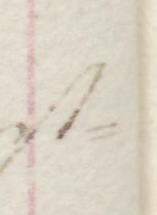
diese
